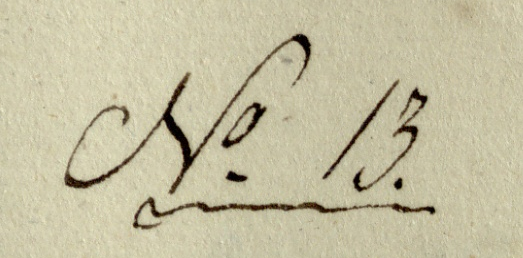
No 13.
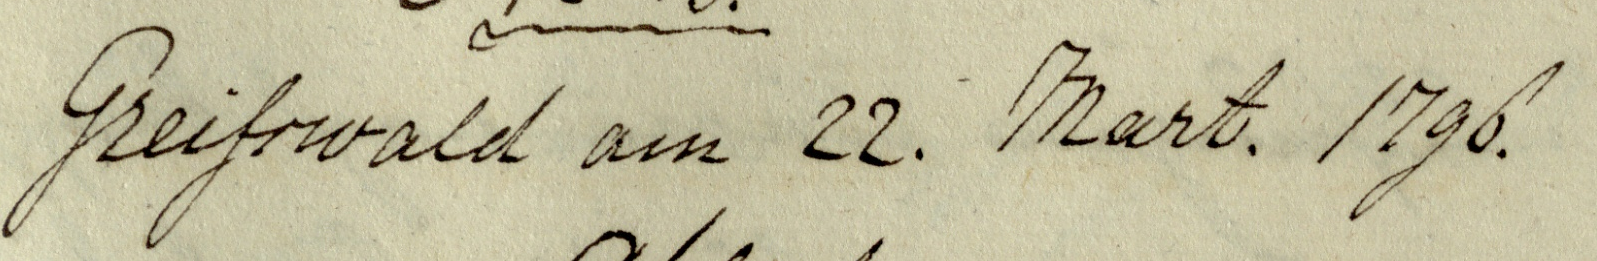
Greifswald am 22. Mart. 1796.
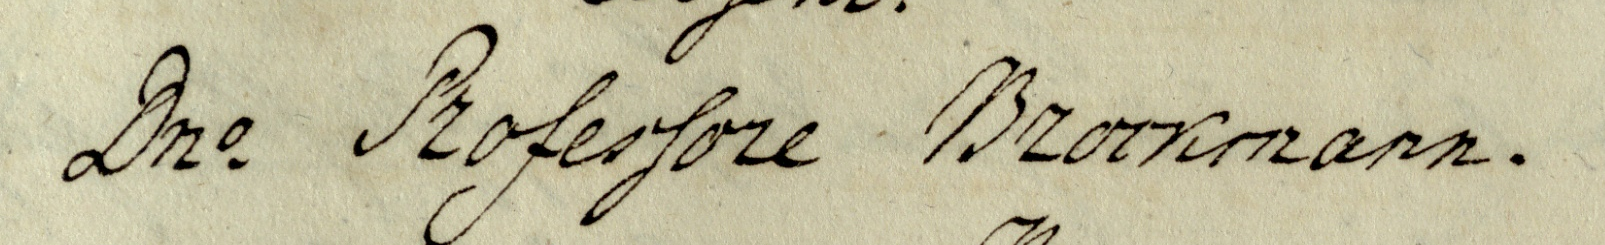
Dno Professore Brockmann.
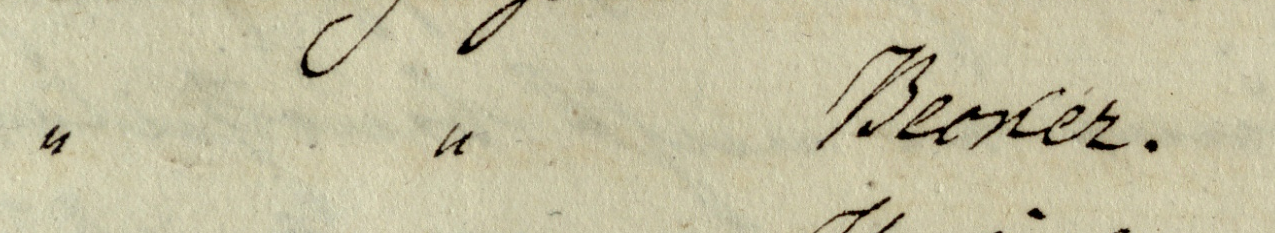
Becker.
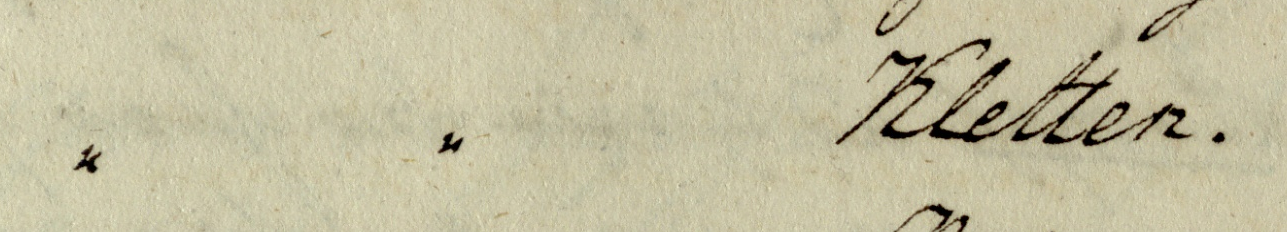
Kletten.
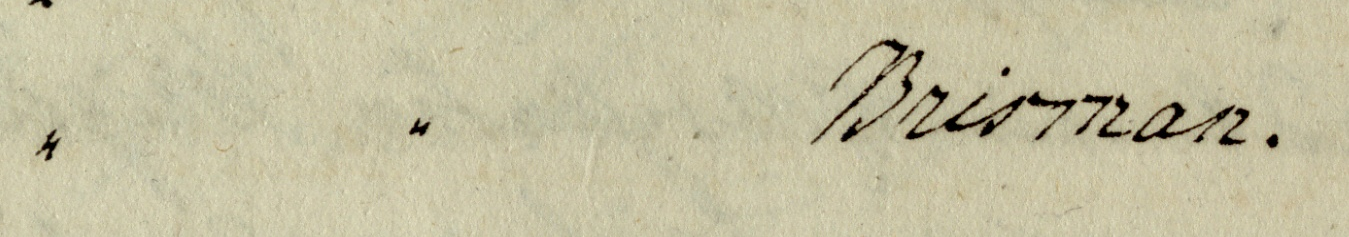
Brisman.
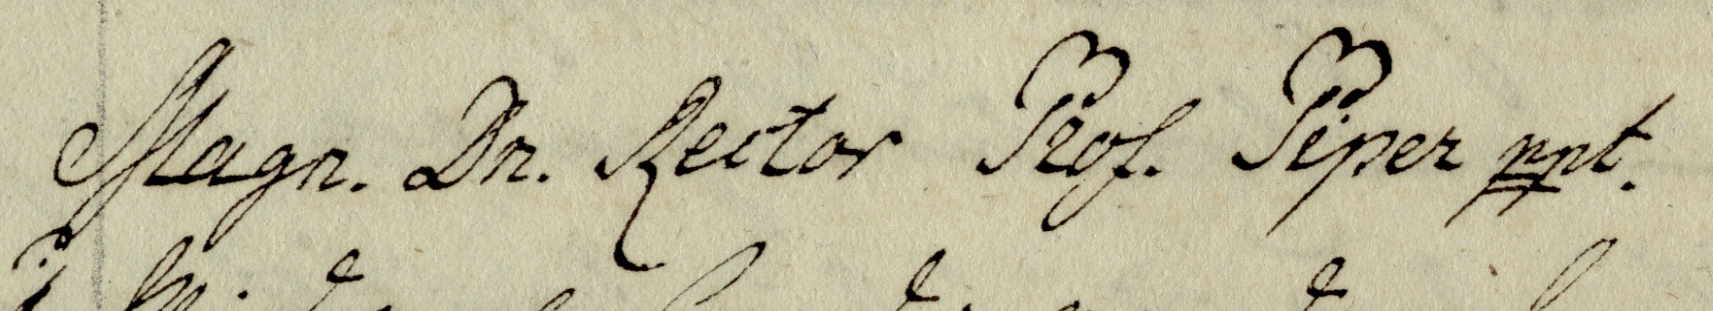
Magn. Dn. Rector Prof. Piper ppt.
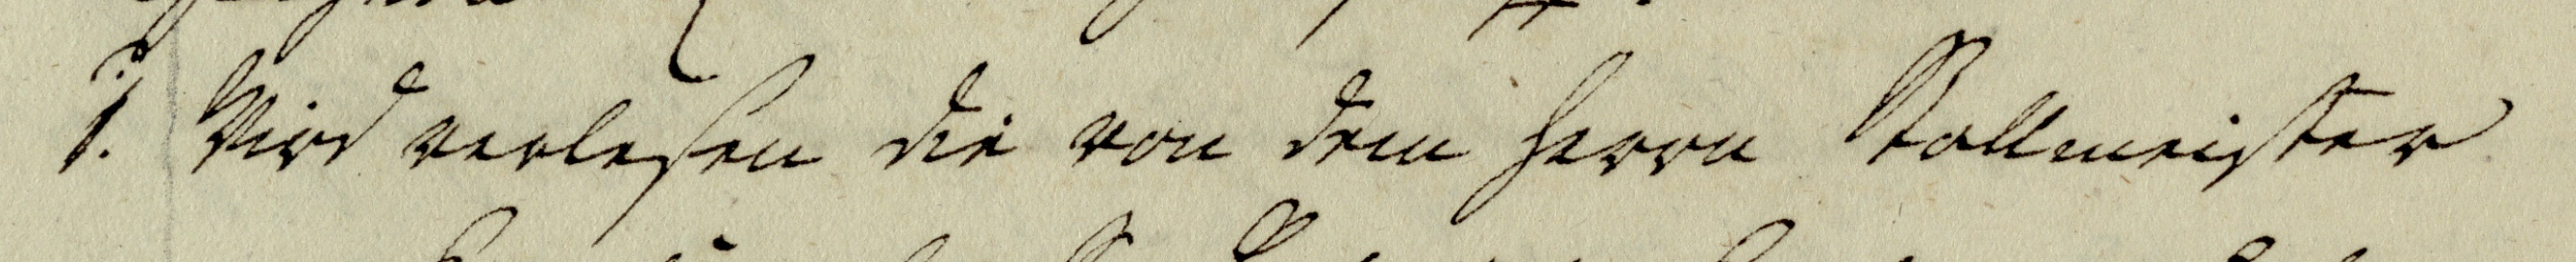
1. Wird verlesen die von dem Herrn Stallmeister
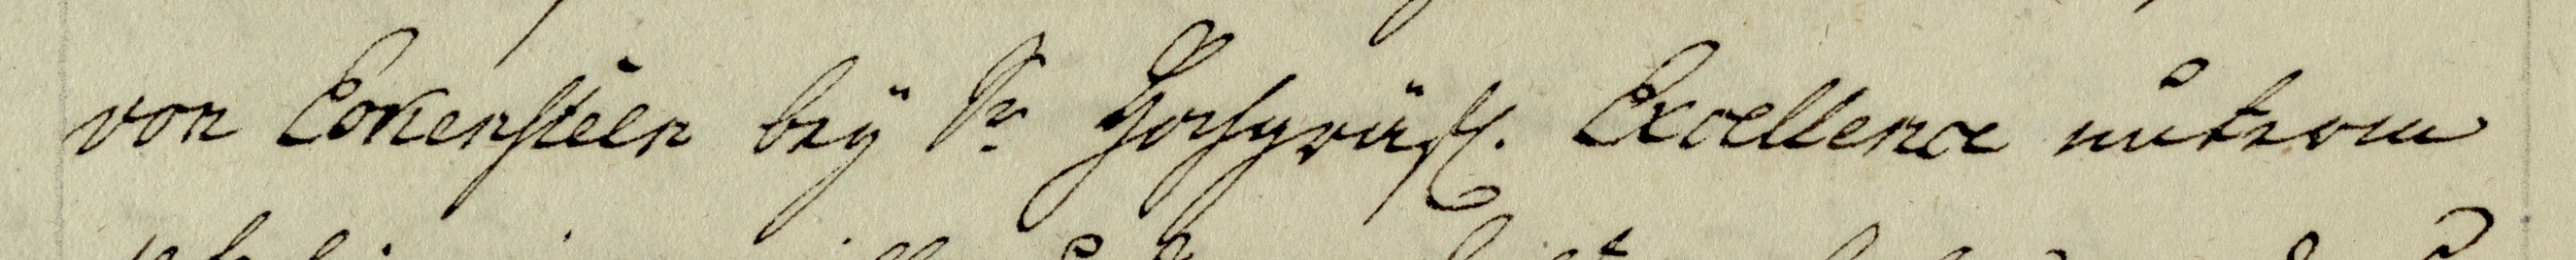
von Eckensteén beÿ Sr Hochgräfl. Excellence unterm
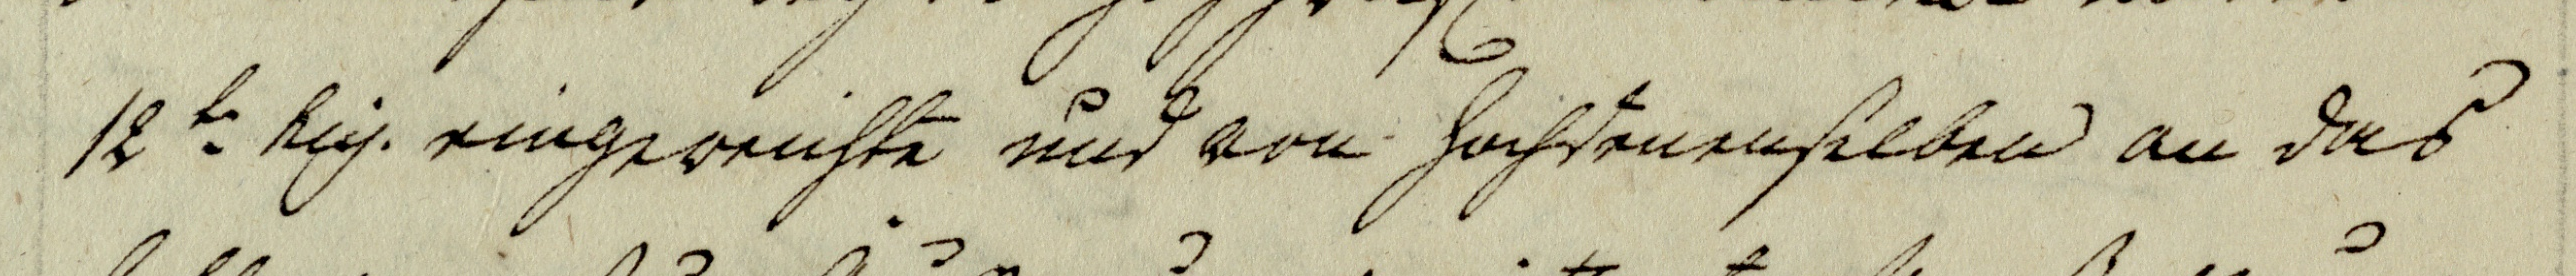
12 t. huj. eingereichte und von Hochdenenselben an das
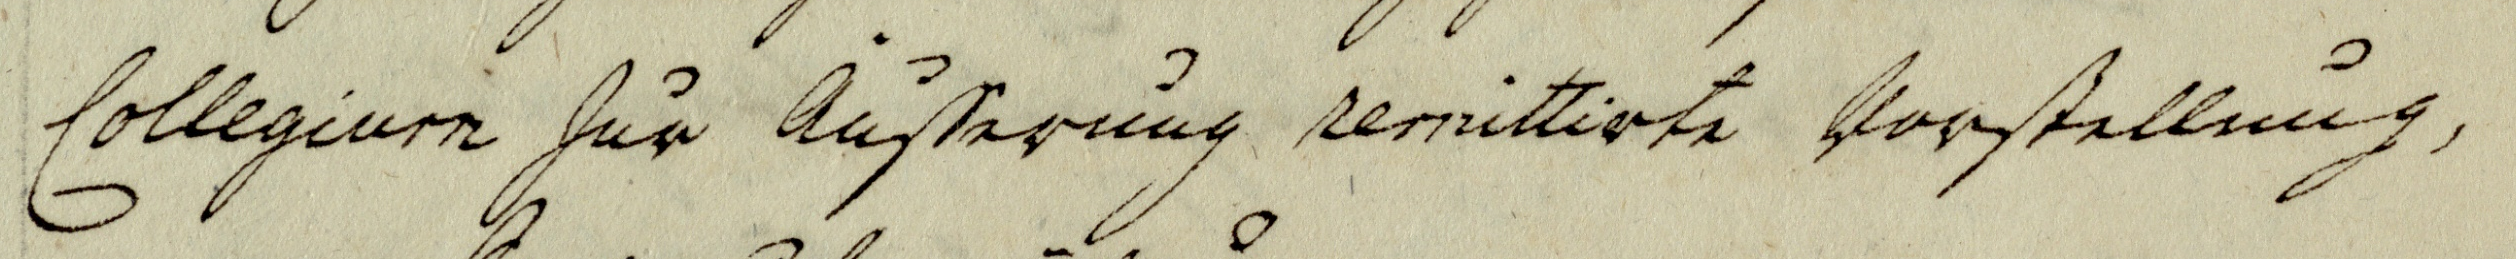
Collegium zur Äusserung remittirte Vorstellung,
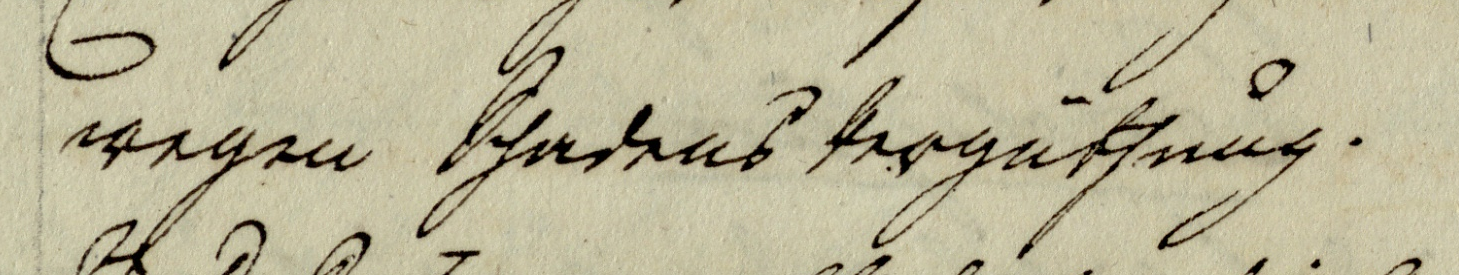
wegen Schadens Vergüthung.
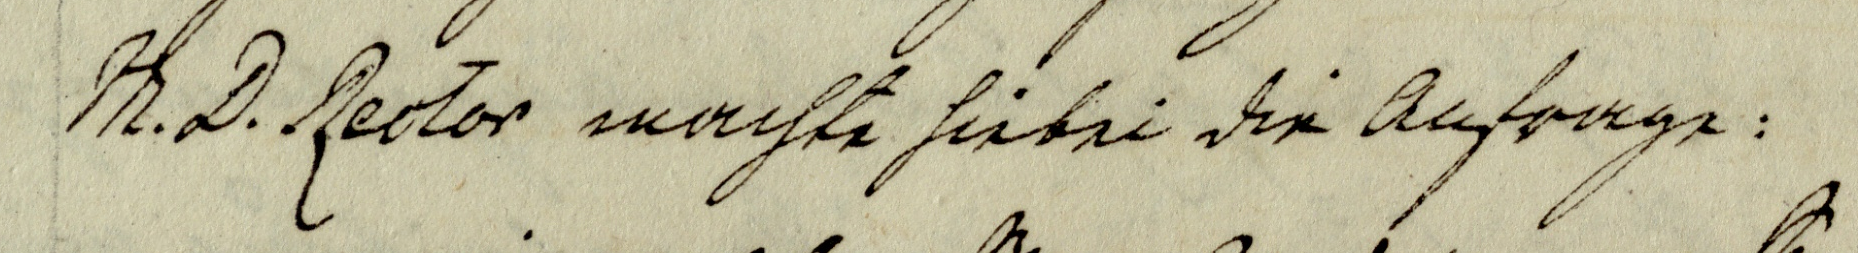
M. D. Rector machte hiebei die Anfrage:
